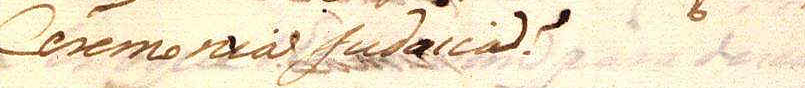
Ceremonias Judaica?
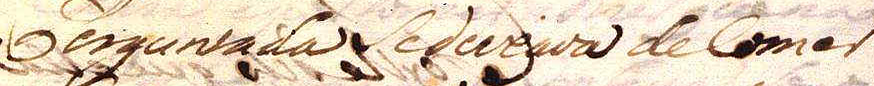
Perguntada se deixava de Comer
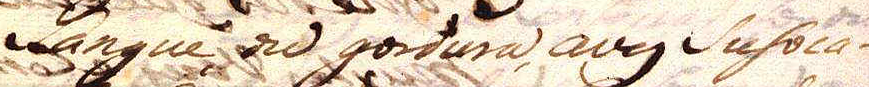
Sangue, ou gordura, aves sufoca
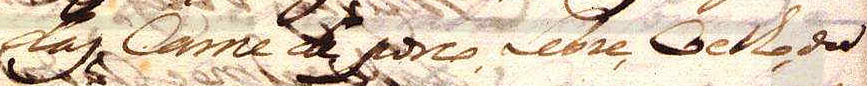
das, Carne de porco, Lebre, Coelho, ou
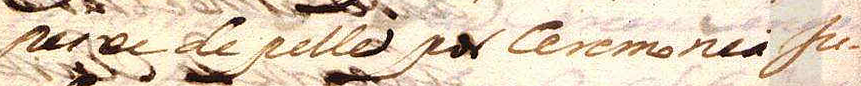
peixe de pelle por Ceremonia Ju
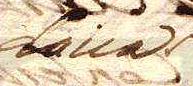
daica?
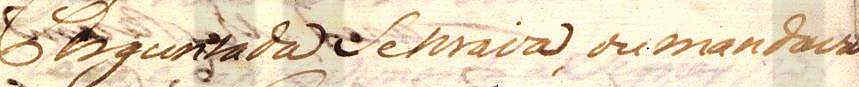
Perguntada se tirava, ou mandava
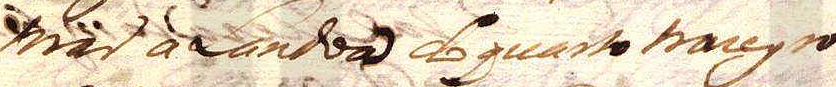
tirar a Landoa do quarto trazeyro
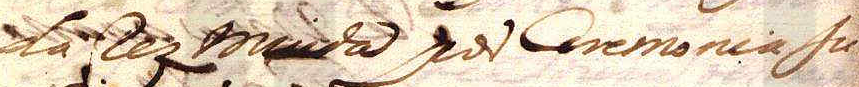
da Rez miuda por Ceremonia Ju
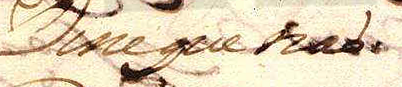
Disse que naõ.
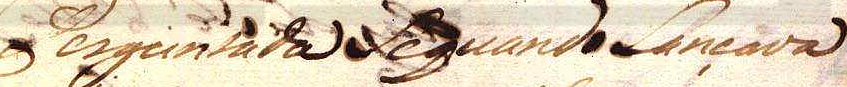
Perguntada se quando Lançava
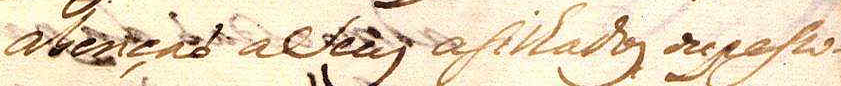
a bençaõ a seus afilhados, ou pesso
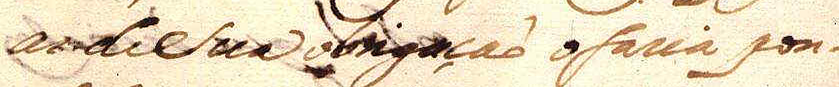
as de sua obrigaçaõ o fazia pon
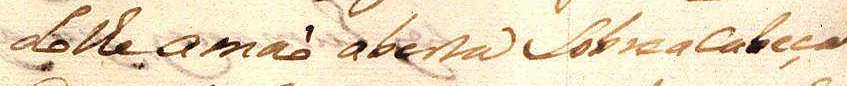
dolhe a maõ aberta sobre a cabeça
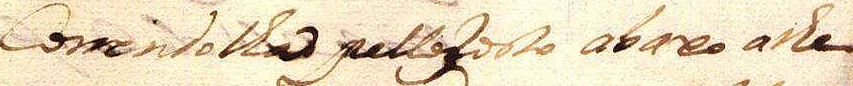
Correndolha pello Rosto abaxo athe
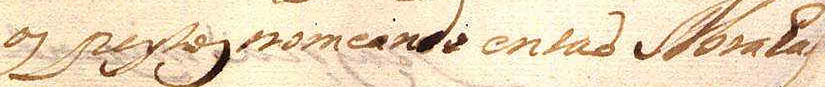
os peytos nomeando então Abraha
